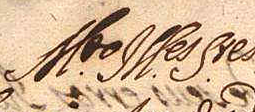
M.to Ill.es S.res
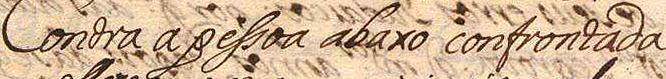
Contra a pessoa abaxo confrontada
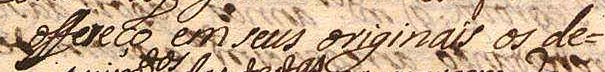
offereço em seus originais os de
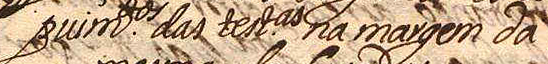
puim.tos das test.as na margem da
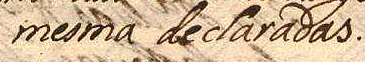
mesma declaradas.
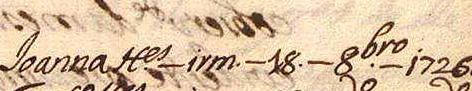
Ioanna H.es - irm. -18. - 8.bro - i726.
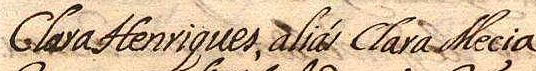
Clara Henriques, aliás Clara Mecia
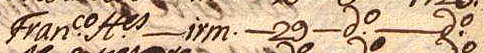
Fran.co H.es - irm. - 29 - d.o - d.o
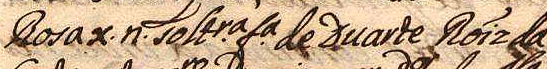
Rosa x. n. soltr.a f.a de Duarte Roīz da
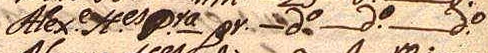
Alex.e H.es P.ra - pr. -d.o - d.o - d.o
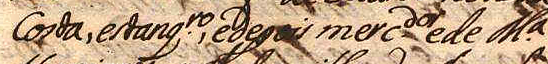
Costa, estanq.ro, e depois merc.dor e de M.a
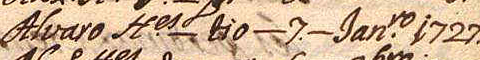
Alvaro H.es - tio -7. - Ian.ro - i727.
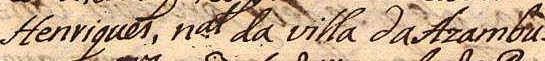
Henriques, na.l da villa da Azambu
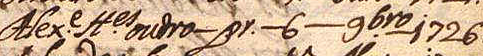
Alex.e H.es outro -pr. - 6 - 9bro. - i726.
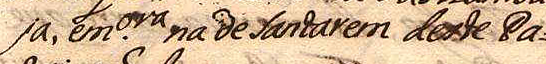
ja, e m.ora na de Santarem deste Pa
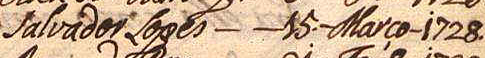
Salvador Lopes - - 15. - Março - i728.
